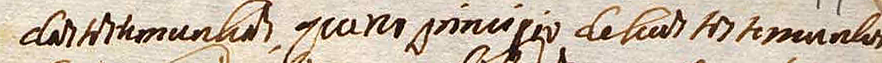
das testemunhas, que no principio de seus testemunhos
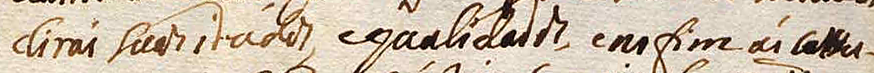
diraõ suas idades, e qualidades, e no fim áo costu
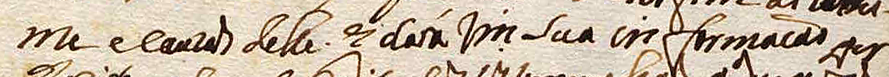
me e cauzas delle. E dará vm sua informaçaõ per
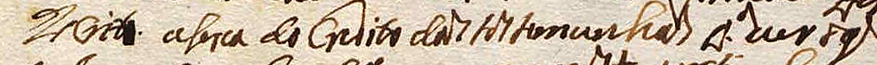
Escrito aserca do Credito das testemunhas p.a uer o q̄
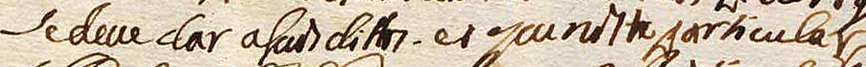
se deue dar a seus dittos. e o que neste particular
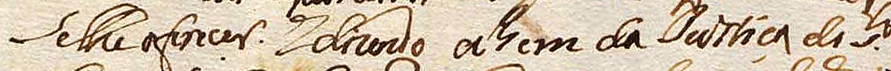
selhe oferecer. E dizendo a bem da Iustiça do s.to
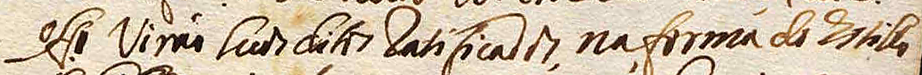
off.o Viraõ huns ditos Ratificados, na forma do Estillo
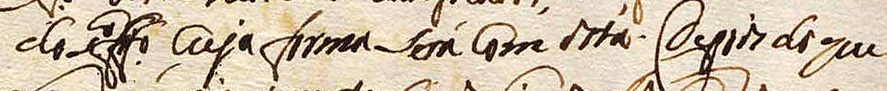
do s.to ffo cuja forma será Com esta. Depois do que
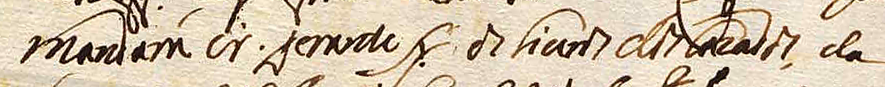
mandará ir perante sy. os Liuros dos Cazados, da
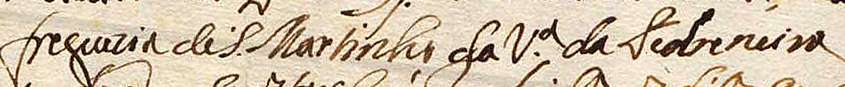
freguezia de S. Martinho da V.a da Pedreneira
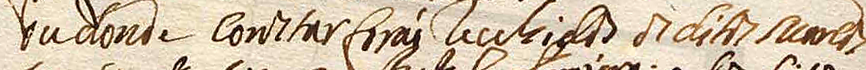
ou donde constar foraõ Recebidos os ditos Marcos
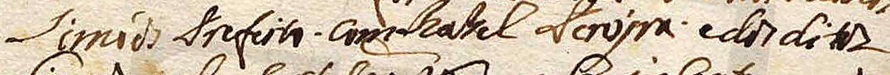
Simoẽs Prefeito com Izabel Perejra e dos ditos
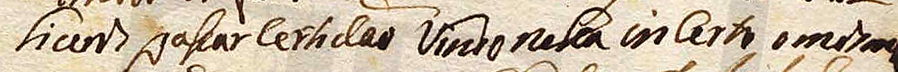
Liuros passar certidão vindo nella inCerto o mesm
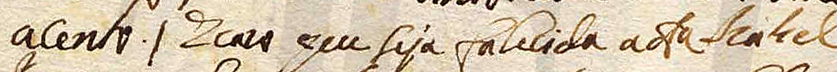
acento./ E caso que seja falecida a d̄a Izabel
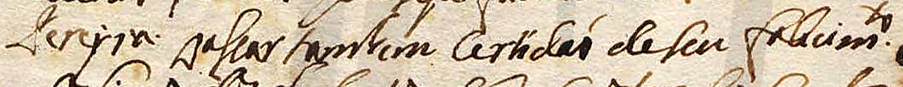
Pereyra. passar tambem certidaõ de seu falecim.to
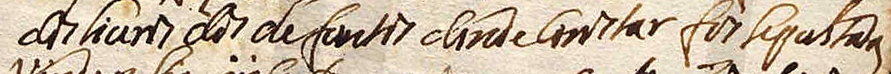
dos Liuros dos defuntos donde Constar for Repostadas
